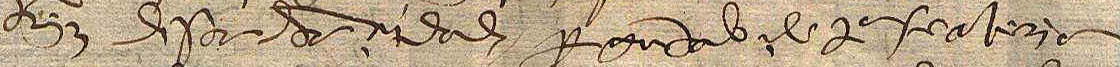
tr̄yz desta d̄ta çidade/ ꝑgūtado ele ta se averia
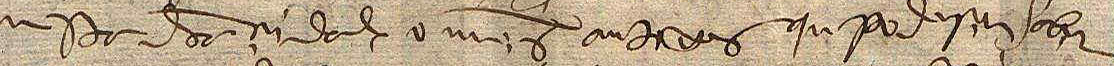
nesta d̄ta çidade om̄es antigos que podesem Saber
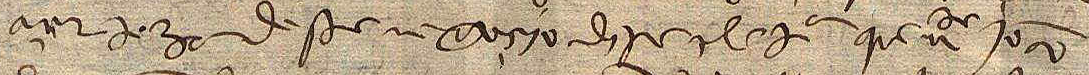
a çerteza deste negoçyo dise ele ta que mte João
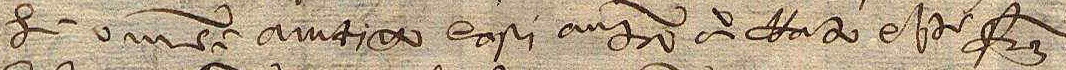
he om̄ee amtigo e asi antão ao Rato e vte f̄rz
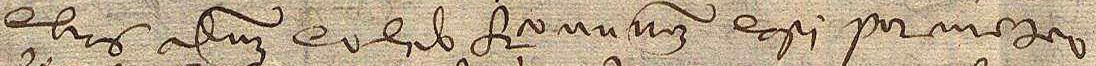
e bras al̄uz e o lçdo frço nun̄ez e asy pormeteo
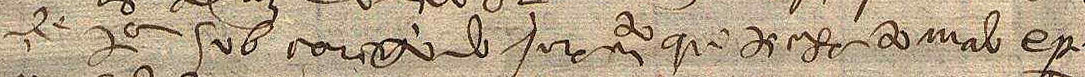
ele ta Sob o cargo do Juramto que tinha tomado e pe
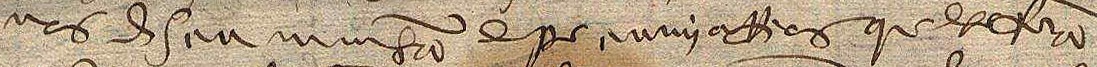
nas descumunhão e pecunyaRias que lhe forão
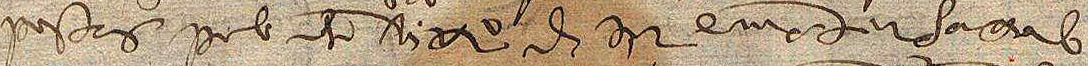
postas pelo d̄to vigro de ter e māter Sagredo
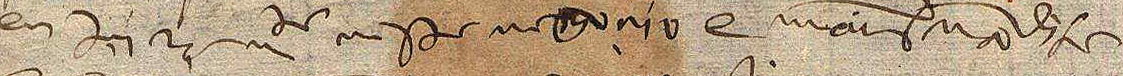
enteiramte neste negoçio e m̄ais não dise
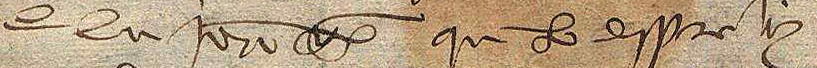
e eu João ḡs que ho esprevy
